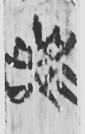若
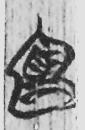{囗馬}
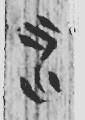水
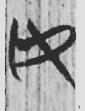女
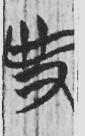拃（作）
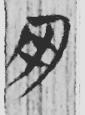舟
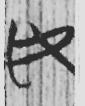女
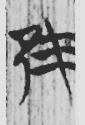隹
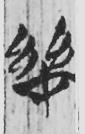𪪋（哉）
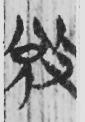敓（說）
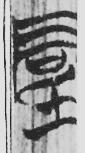砥
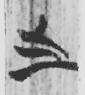之
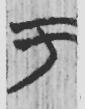于
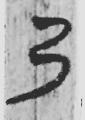乃
